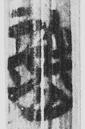{酉冘臼}（沈）
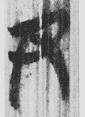尹
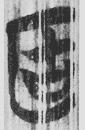固
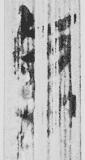怠（辭）
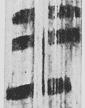王
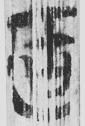固
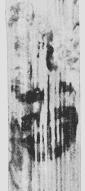昏（問）
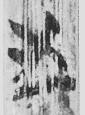之
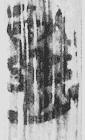{酉冘臼}（沈）
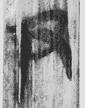尹
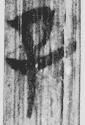子
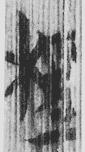{木巠}（莖）
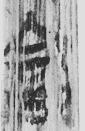合（答）
